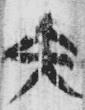內
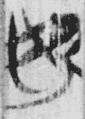𡚦（焉）
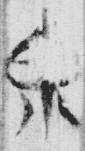余
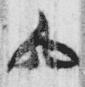穴
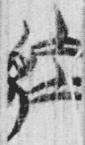○（窺）
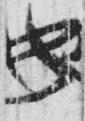𡚦（焉）
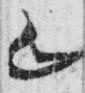㠯（以）
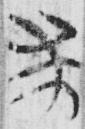求
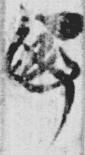臤（賢）
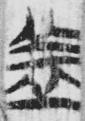者
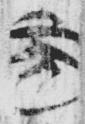而
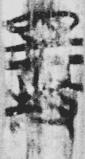襄（讓）
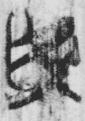𡚦（焉）
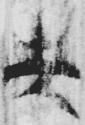○（堯）
